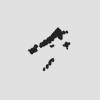利
